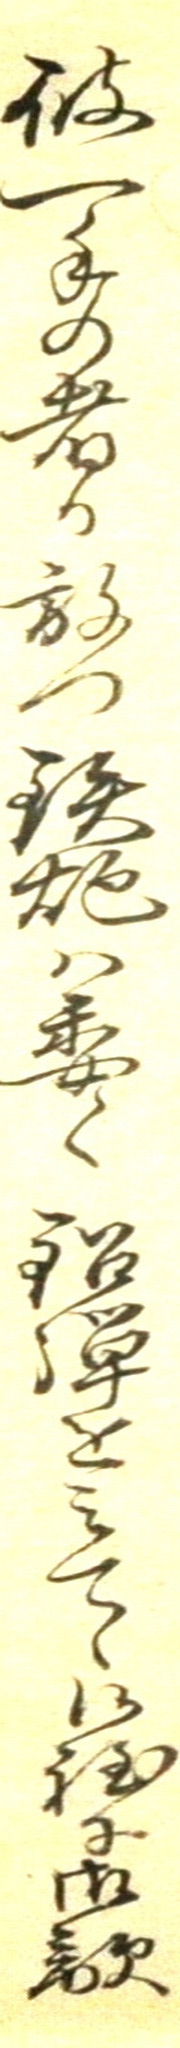彼一手の者か放つ鉄炮は委く鉛弾をみてゝ候程に御敵
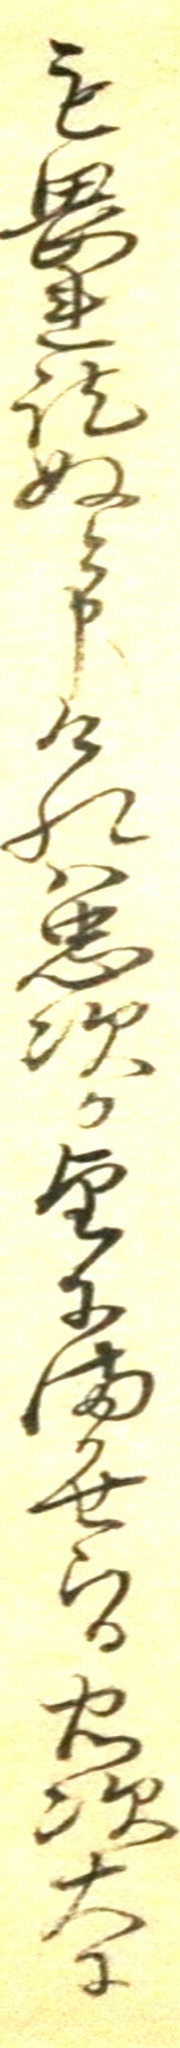も畏れ訖ぬと申けれは忠次か望にまかせらる忠次大に
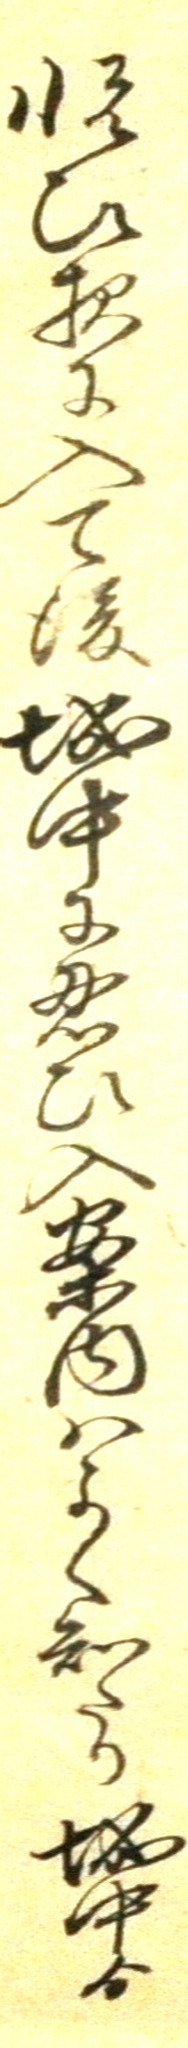悦ひ夜に入て後城中に忍ひ入案内はよく知たり城中より
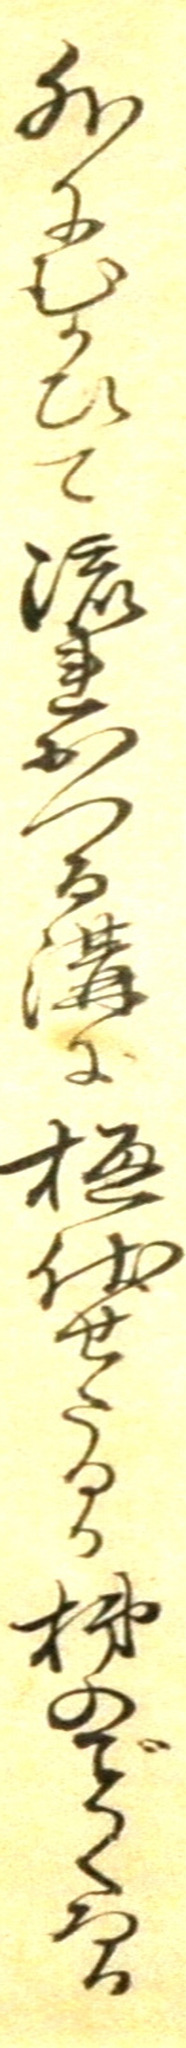外にむかひて流れおつる溝に樋伏せたるか梯のごとくなる
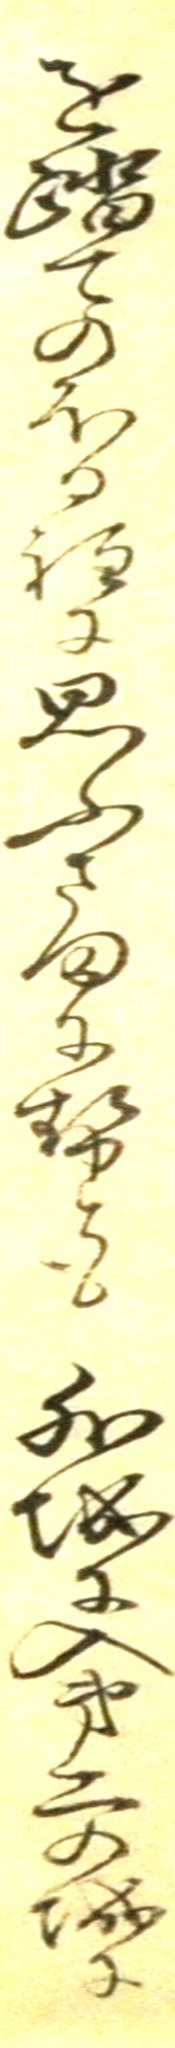を踏てのほる程に思ふさまに勢とも外城に入第二の城に
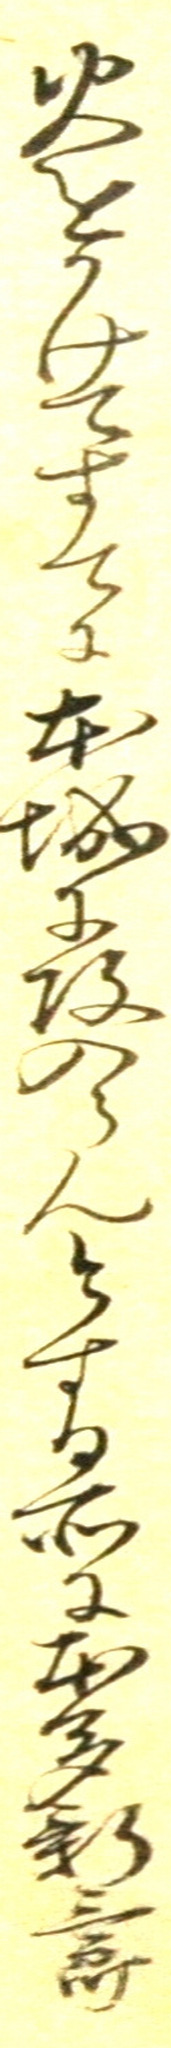火をかけてすてに本城に攻入らんとする所に本多新三郎

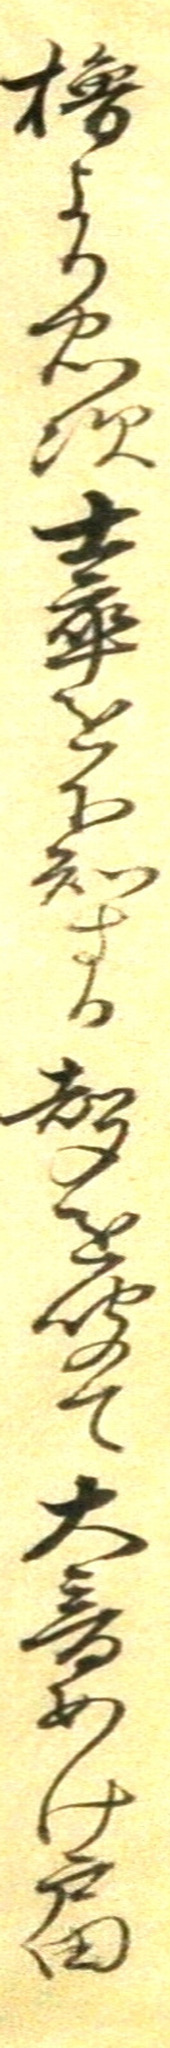櫓より忠次士卒を下知する声を聞て大音あけ戸田
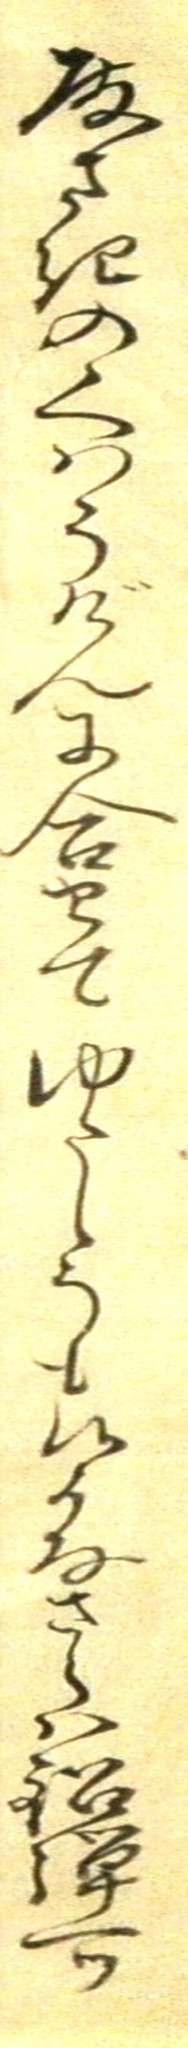殿さきのくわうげんに合せてゆゝしうも候かなさらは鉛弾一ッ
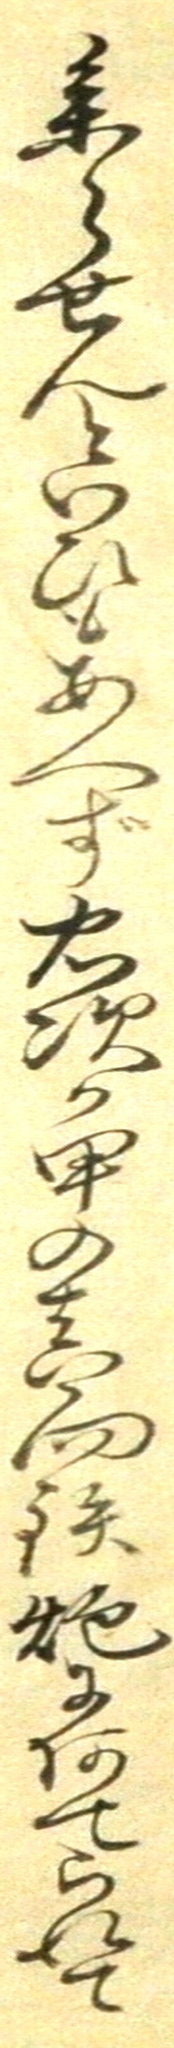参らせんといひもあへず忠次か甲の真向鉄炮にあてられて
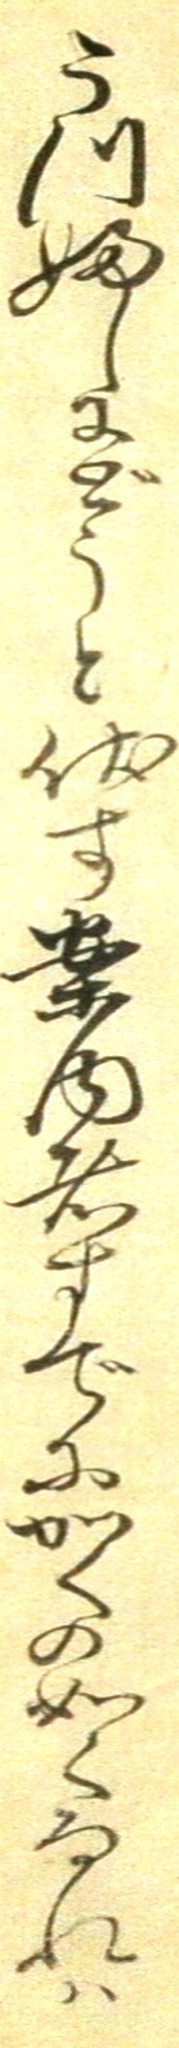うつふしにどうと伏す案内者すでにかくの如くなれは
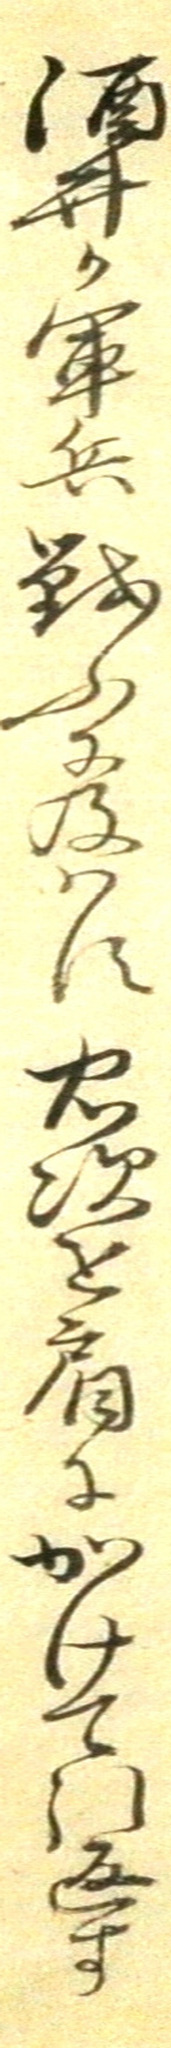酒井か軍兵戦ふに及はす忠次を肩にかけて引返す
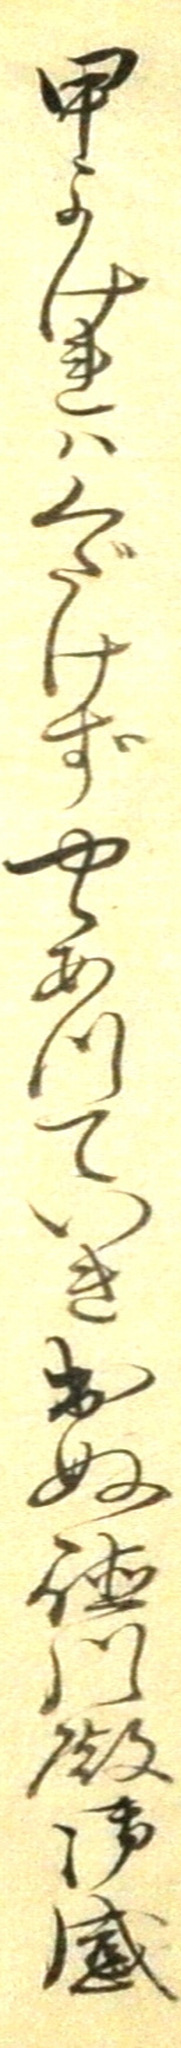甲よけれはくだけずやゝあつていき出ぬ徳川殿御感
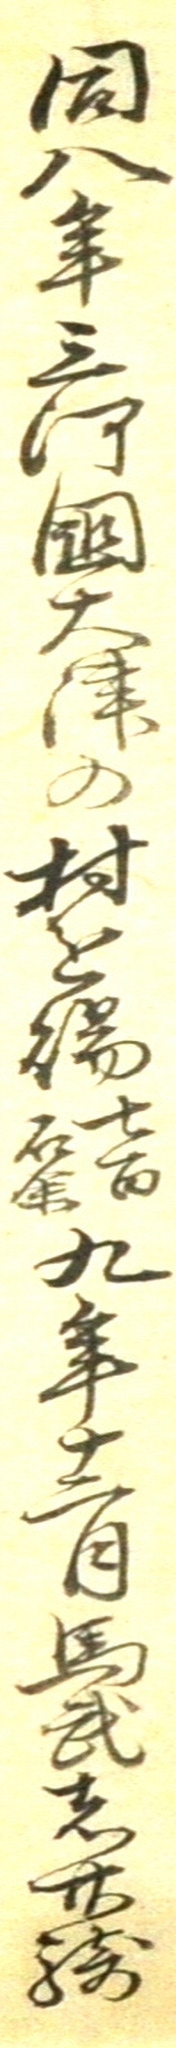同八年三河国大津の村を賜七百石余九年十二月馬武者廿騎
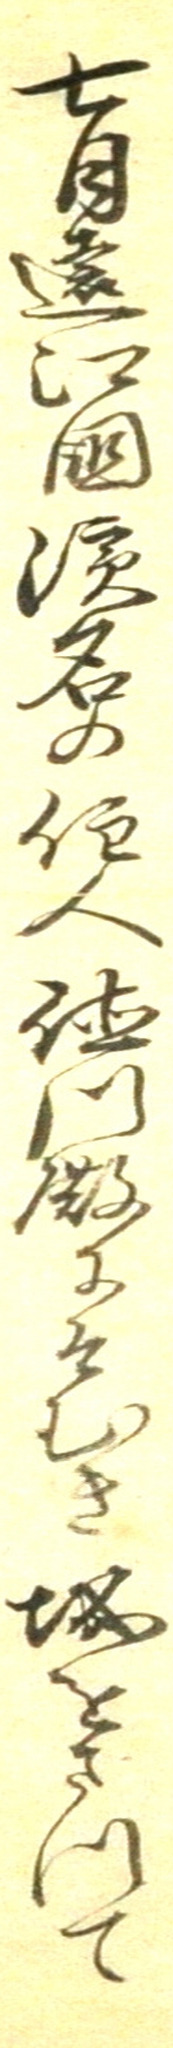七月遠江国浜名の住人徳川殿にそむき城をさつて
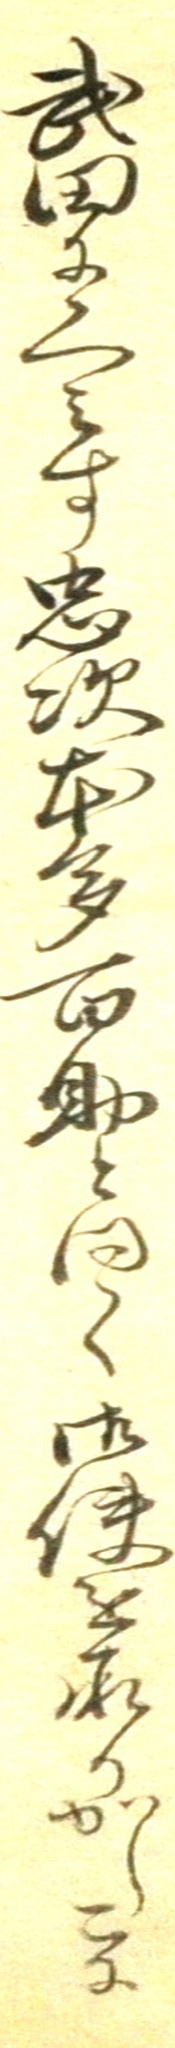武田にくみす忠次本多百助と同く御使を承りかしこに
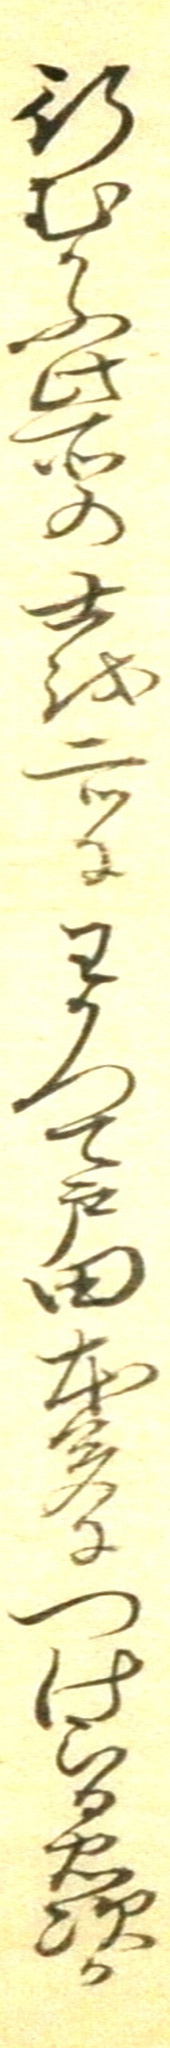行むかふ此所の士を二ッにわかつて戸田本多につけらる忠次か
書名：藩翰譜（四・下）
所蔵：伊那市立高遠町図書館・合同会社AMANE
